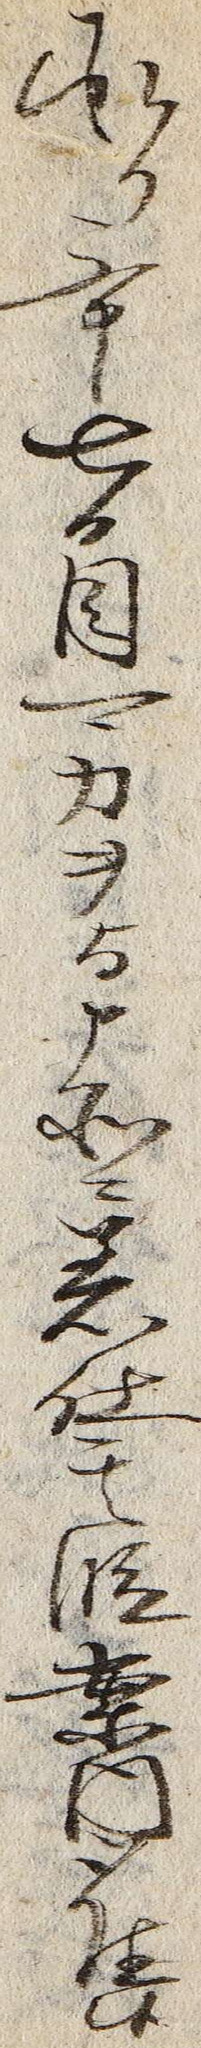承り不申七日目マカヲと申所に着仕其段案内御座候
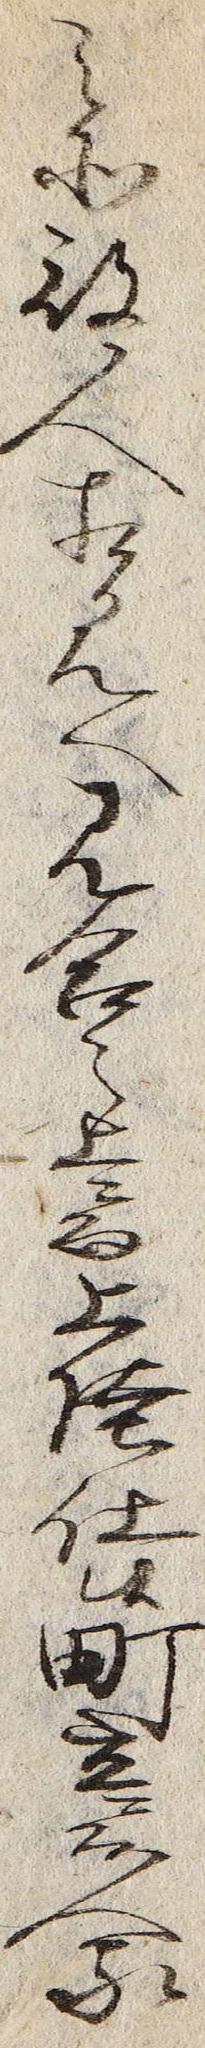の所役人相見へ見合の上にて上陸仕候町立にて人家
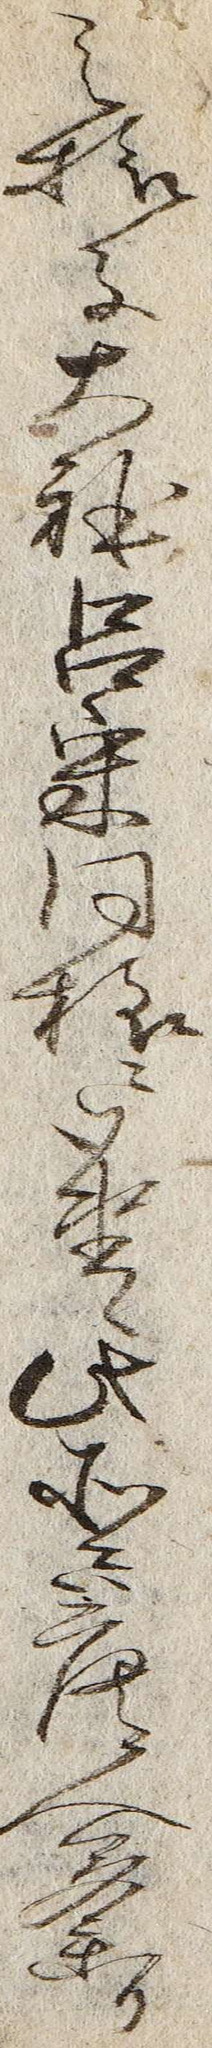の様子大体呂宋同様に御座候此所には唐人多参り
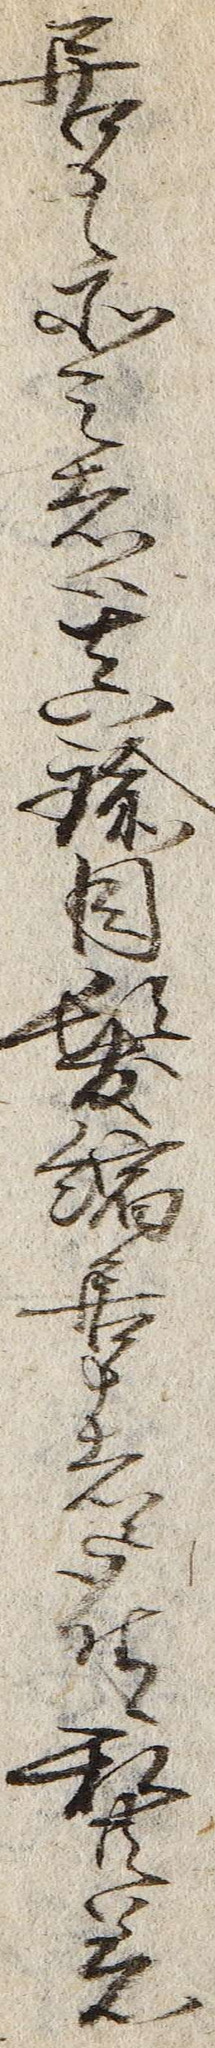居申候所の者は真鍮目髪編居申者御座候私ども着
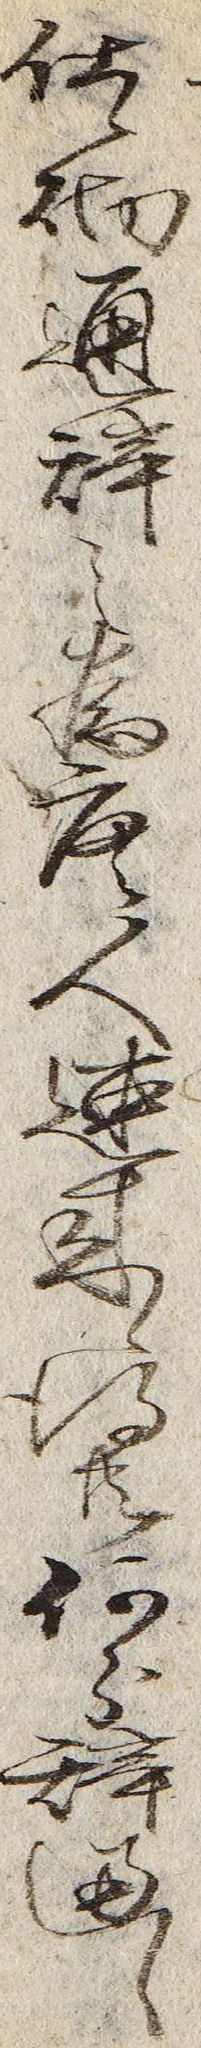仕候砌通辞の為唐人連来候得ども何分辞通し
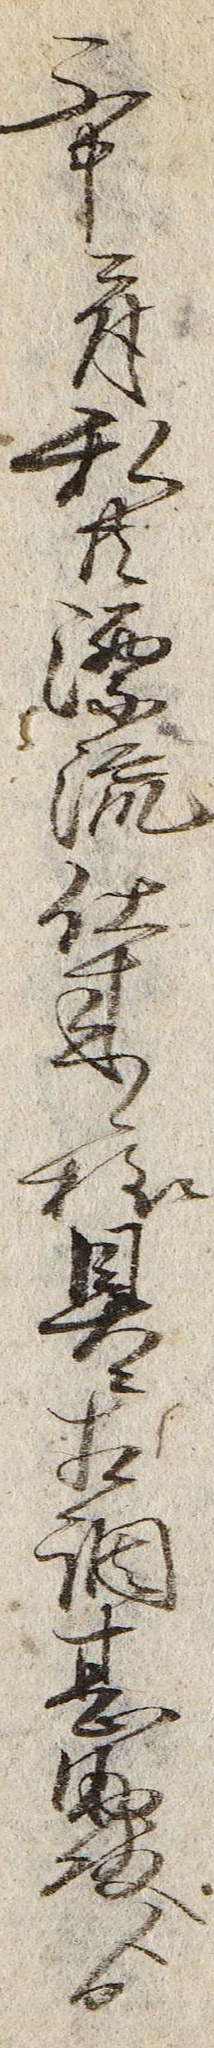不申に付私ども漂流仕来候様具に相調甚助殿より
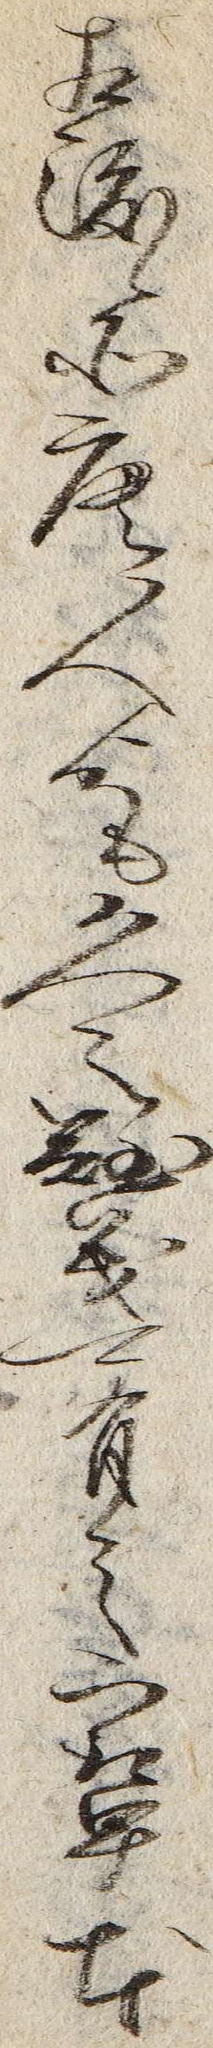相渡候所唐人よりもの難儀可有之最早本
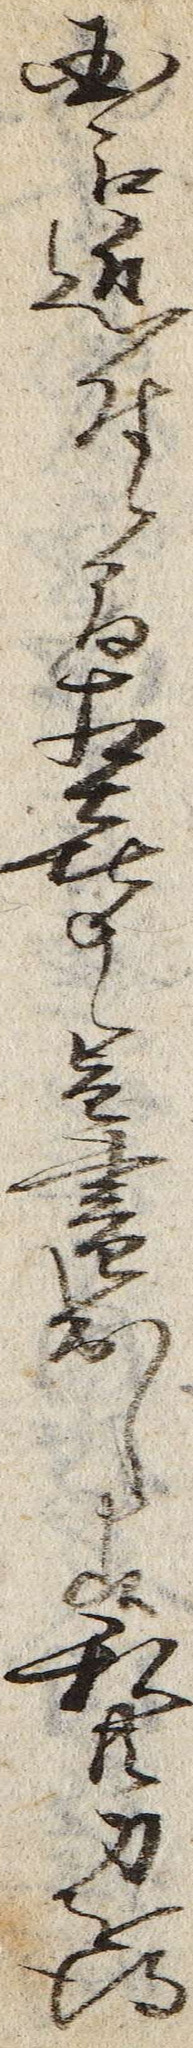国へ近付候間相喜申候旨書出し申候私ども力を得
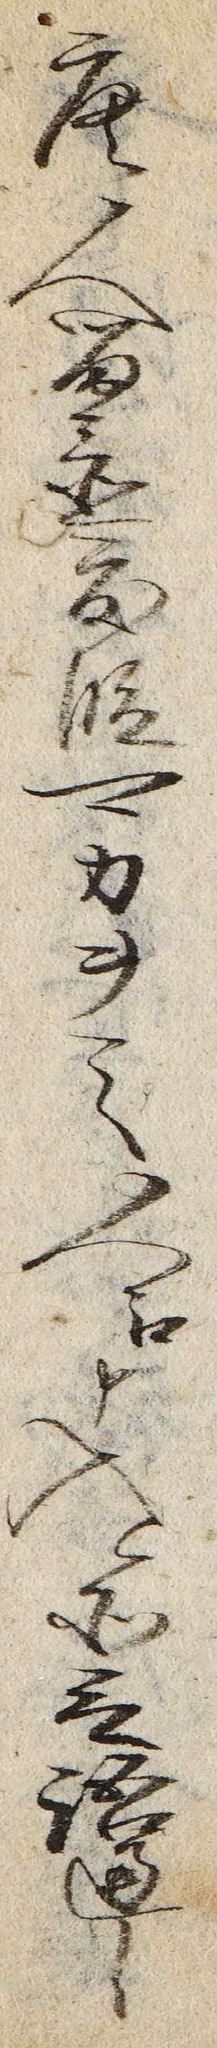唐人留置度段マカヲの人へ申入候所言語通し

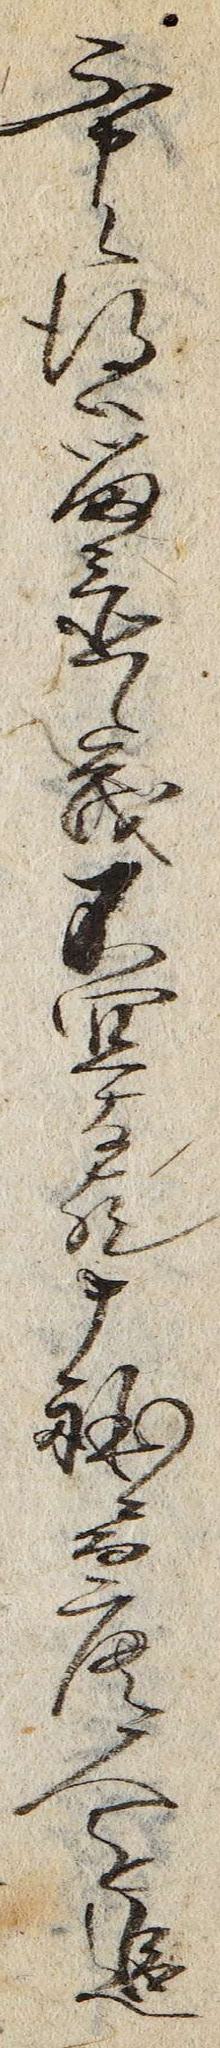不申候得は留置候も不宣と歟申体にて唐人を追
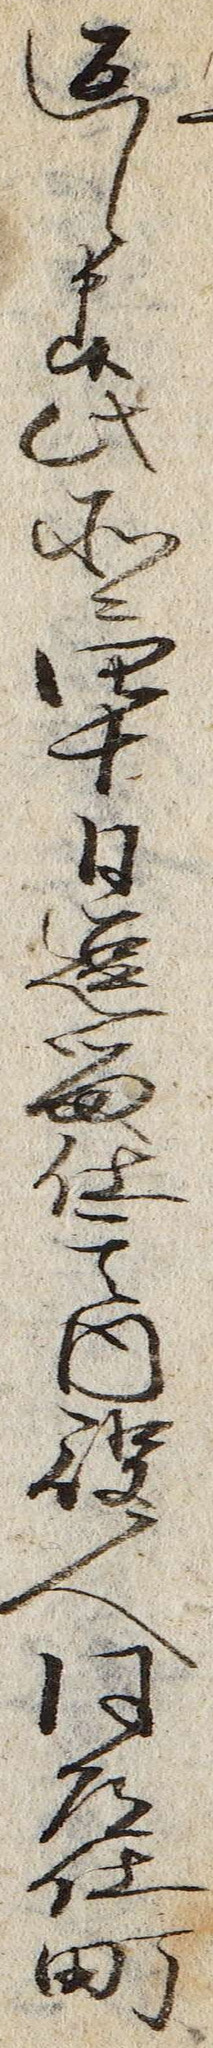返し申候此所に四十日逗留仕其内役人同道仕町
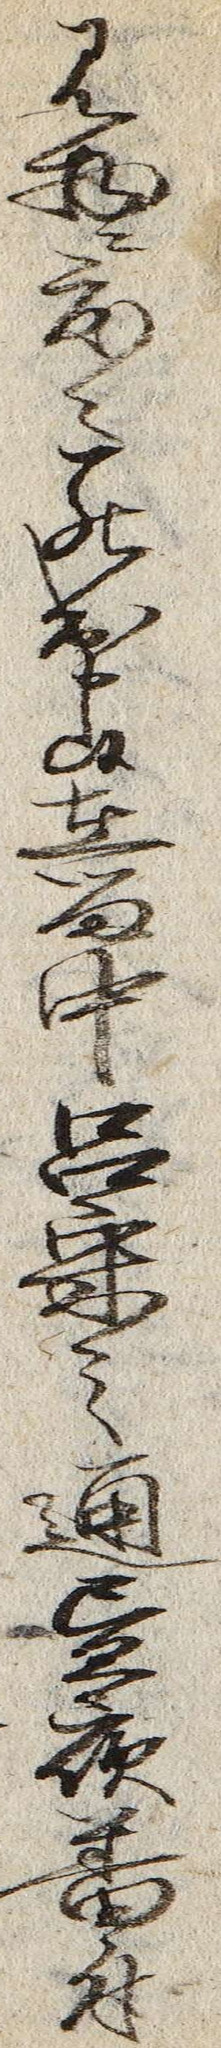見物に度々罷出申候在留中呂宋の通昼夜番付
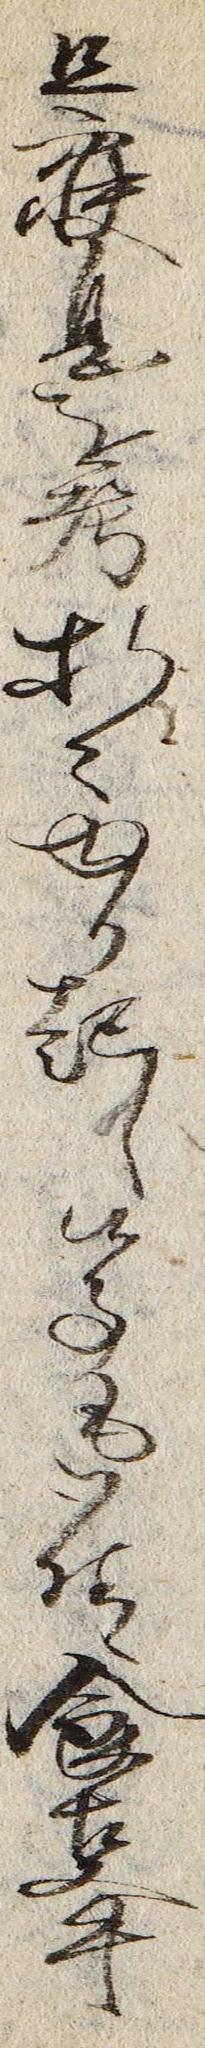且寝息を考折々ゆり起し候事も御座候食事牛
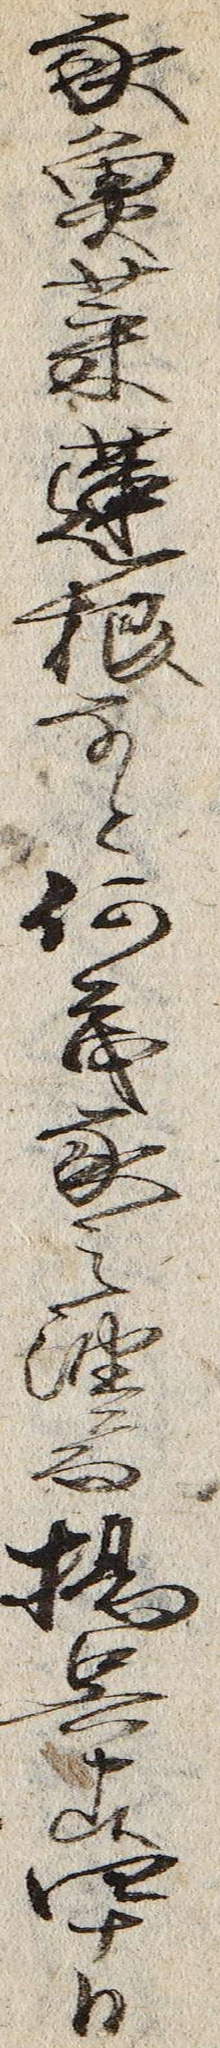豕魚菜蓮根なと何も豕の油にて揚呉申候四十日
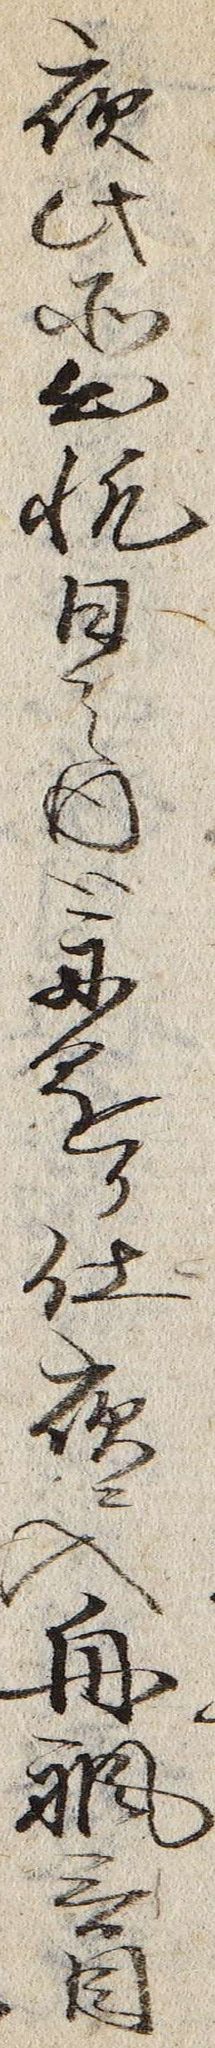夜此所出帆日の内は舟懸り仕夜に入舟䑺三日目
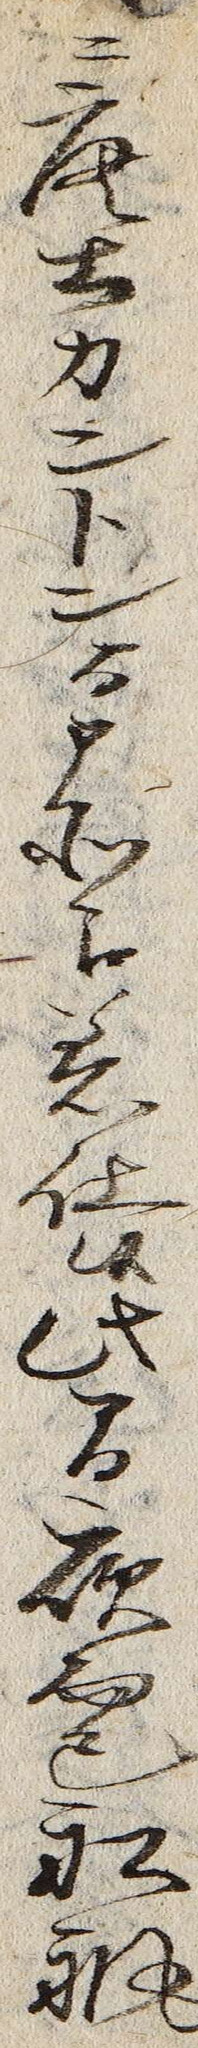に唐土カントンと申所へ着仕候此間夜のみ船䑺
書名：能登国清兵衛異国江漂流之始末
